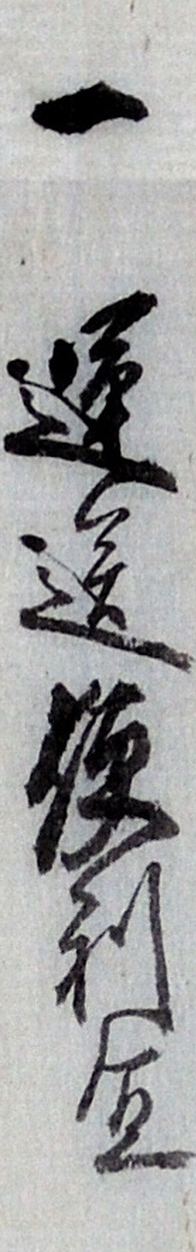一運送便利宜
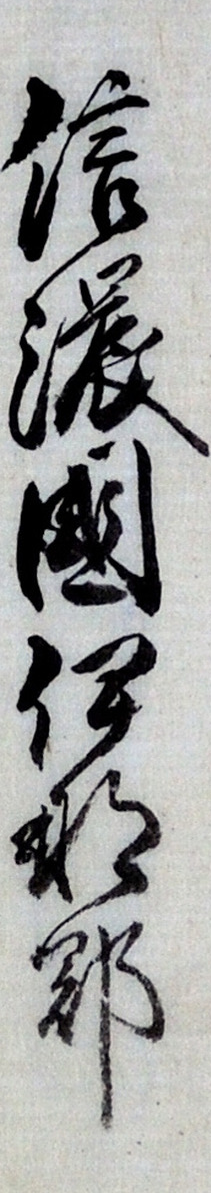信濃国伊那郡
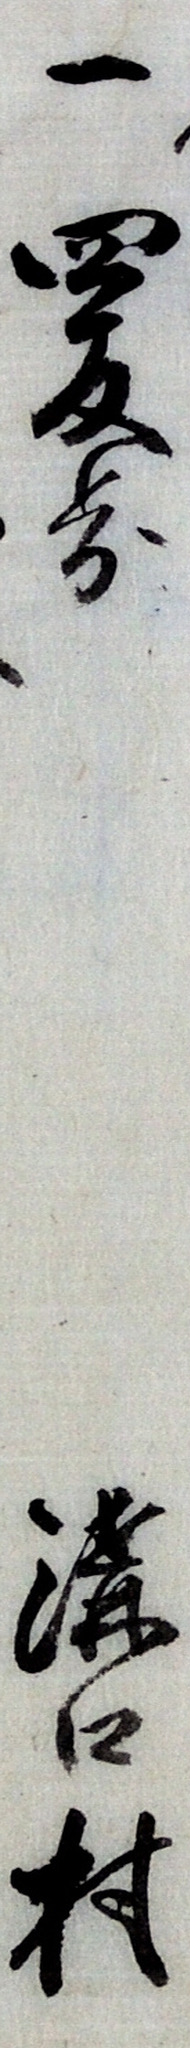一四反歩溝口村
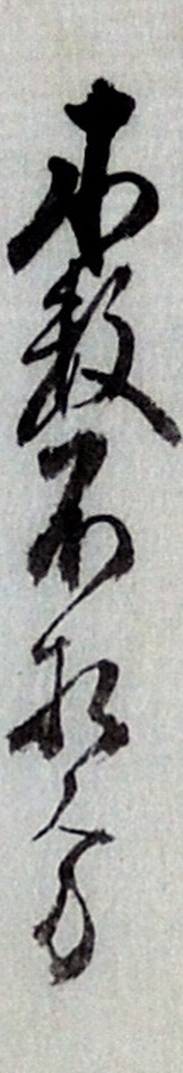木数不相分
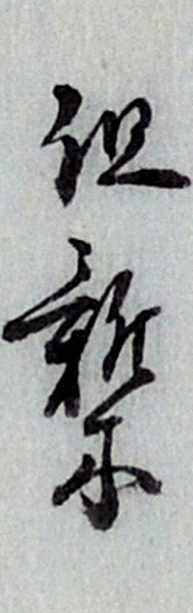但雑木
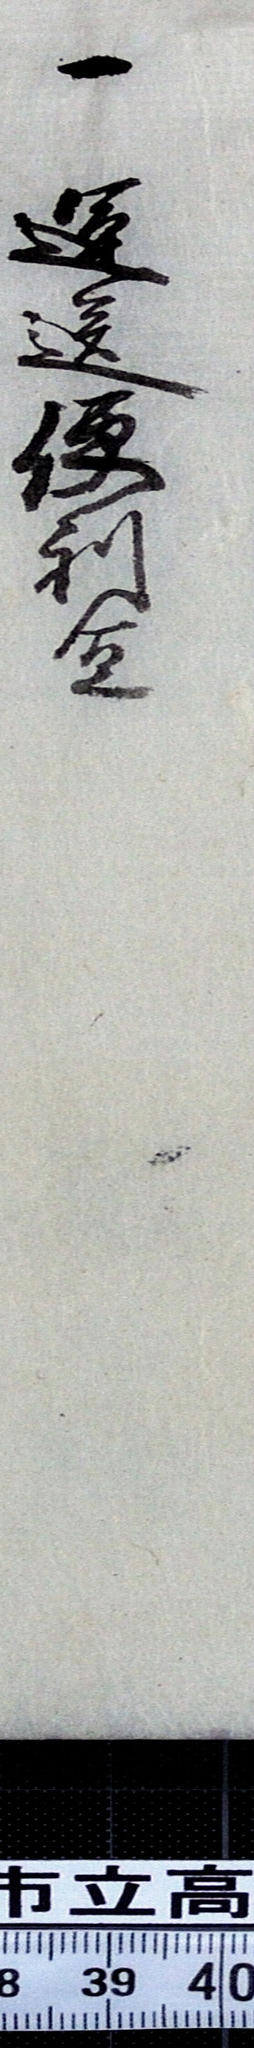一運送便利宜
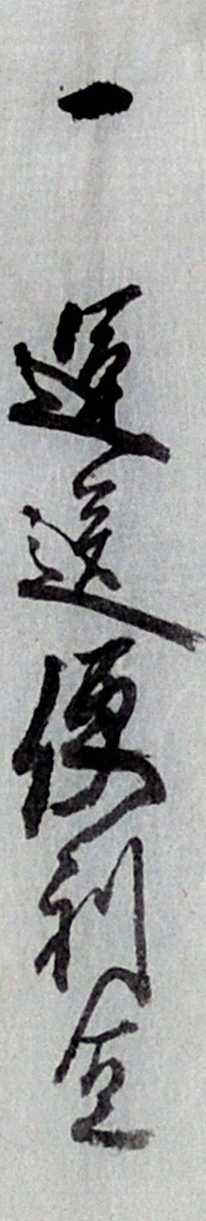一運送便利宜

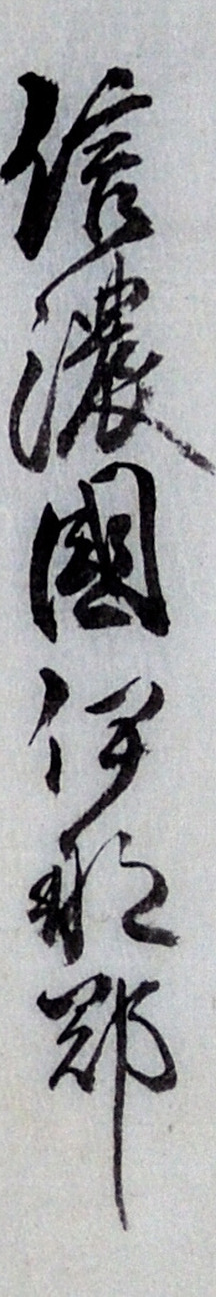信濃国伊那郡
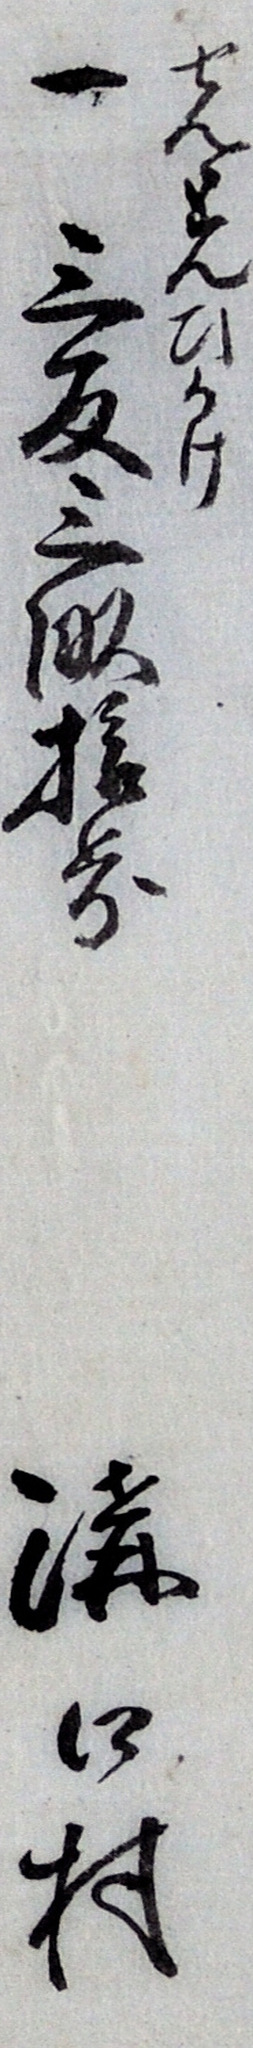一三反三㽗拾歩溝口村
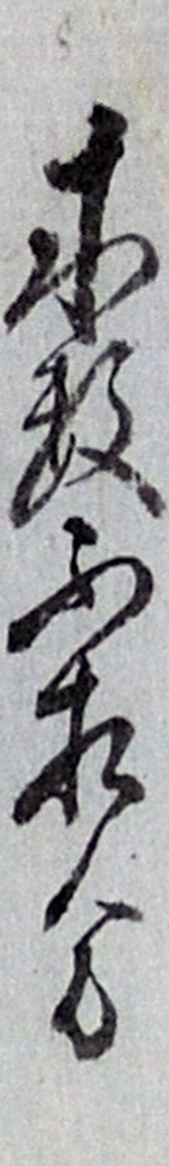木数不相分
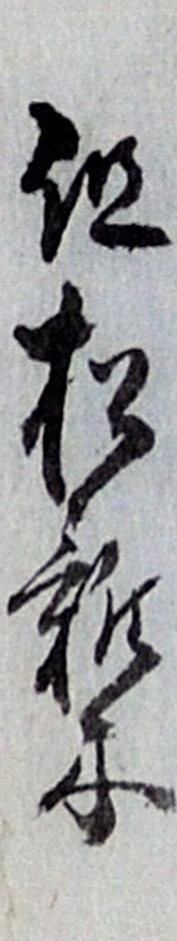但松雑木
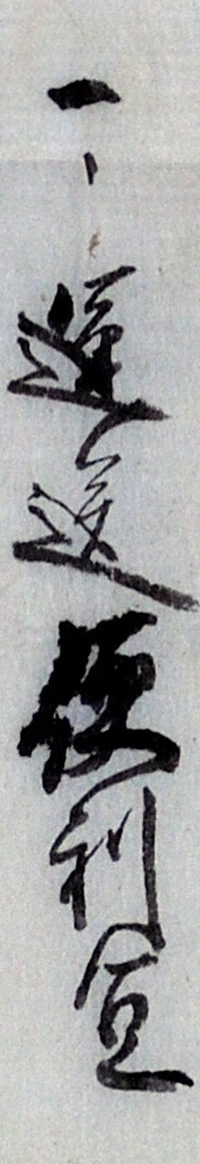一運送便利宜
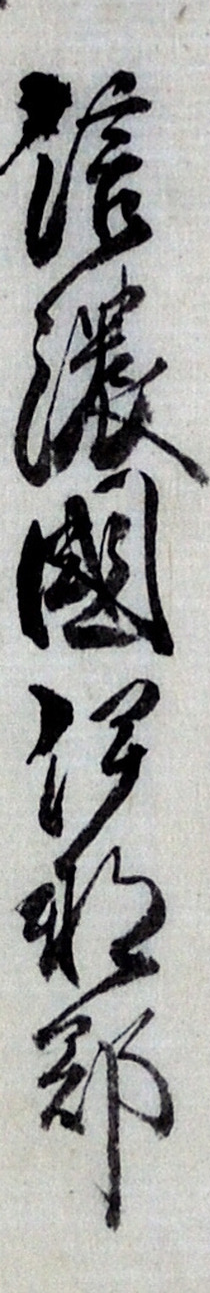信濃国伊那郡
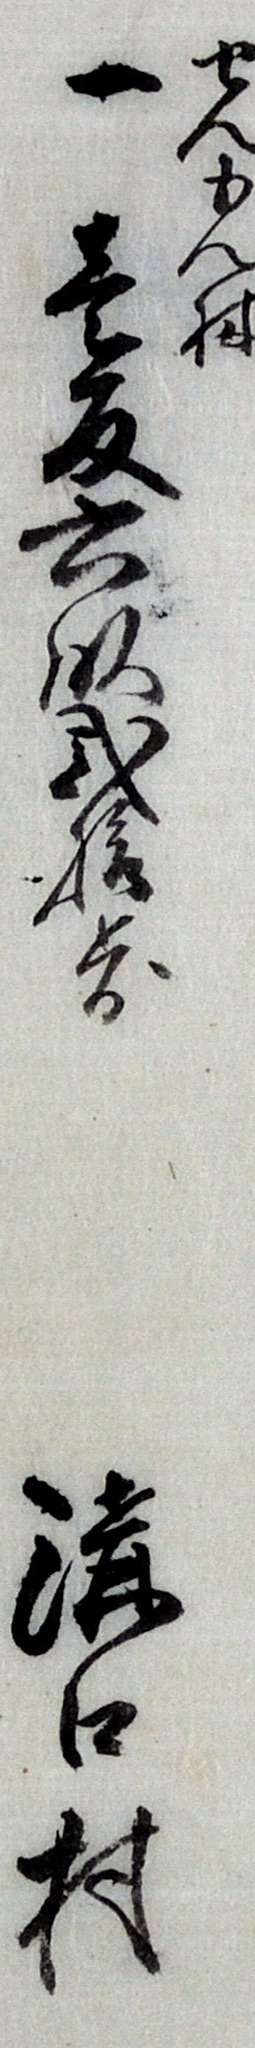一壱反六㽗弐拾歩溝口村
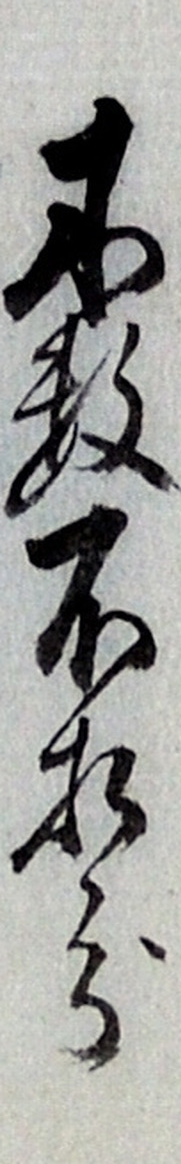木数不相分
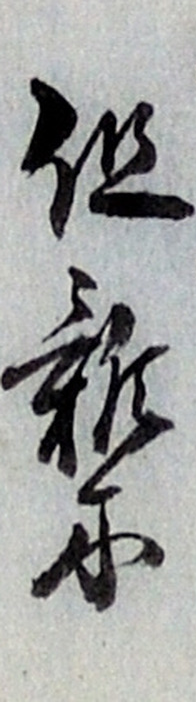但雑木
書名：官林反別帳
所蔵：伊那市立高遠町図書館・合同会社AMANE
